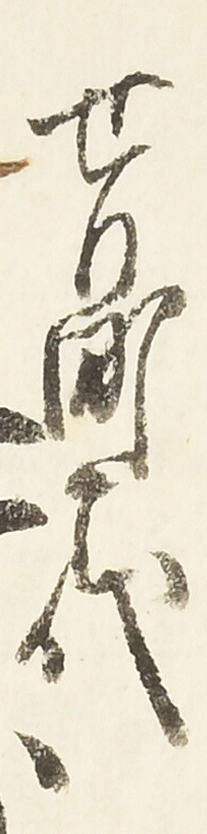せり町丁代
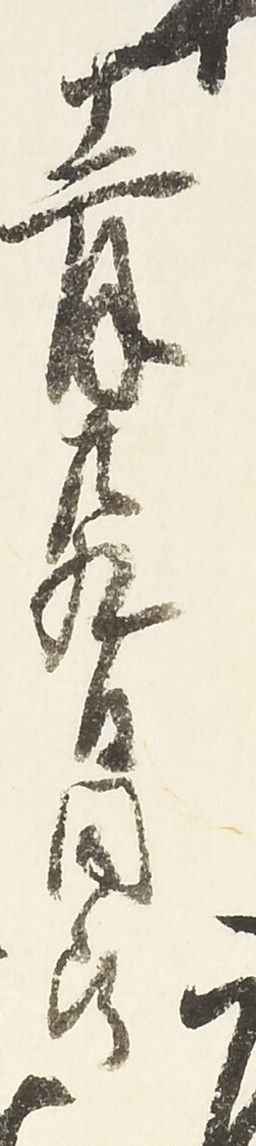十二月廿九日同断
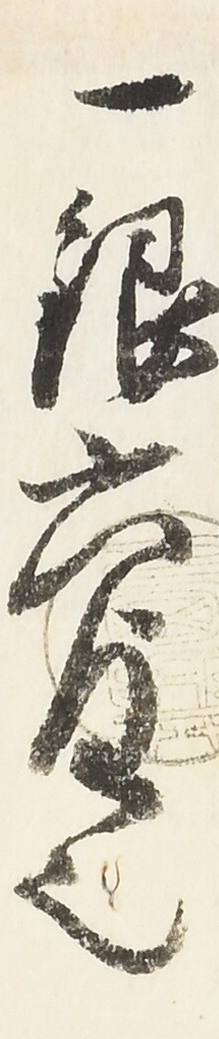一銀六匁也
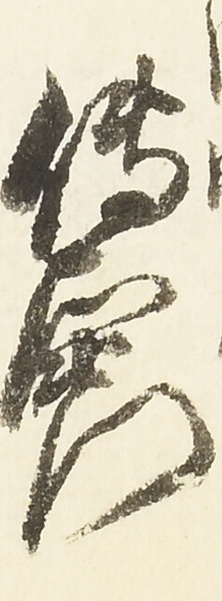伝右衛門
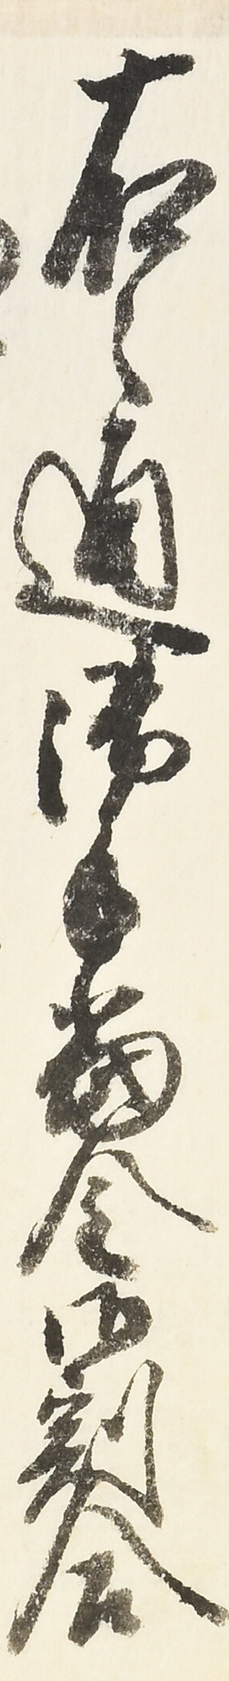右之通御手当金御割合
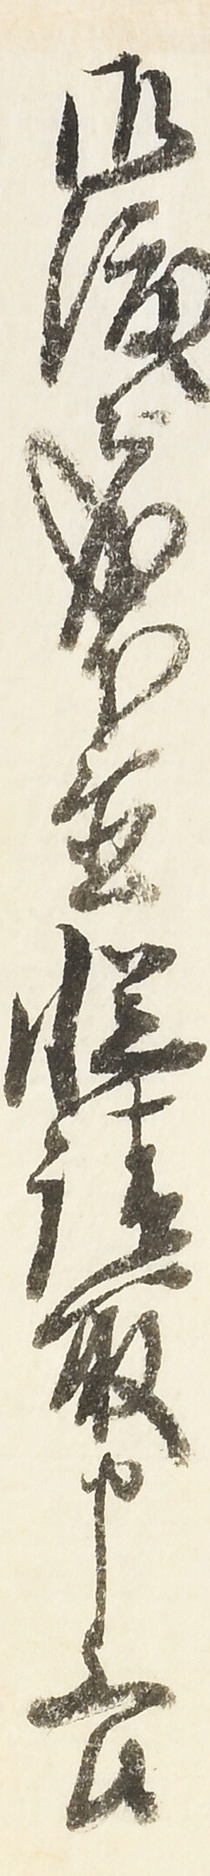御渡被成下置慥請取申上候
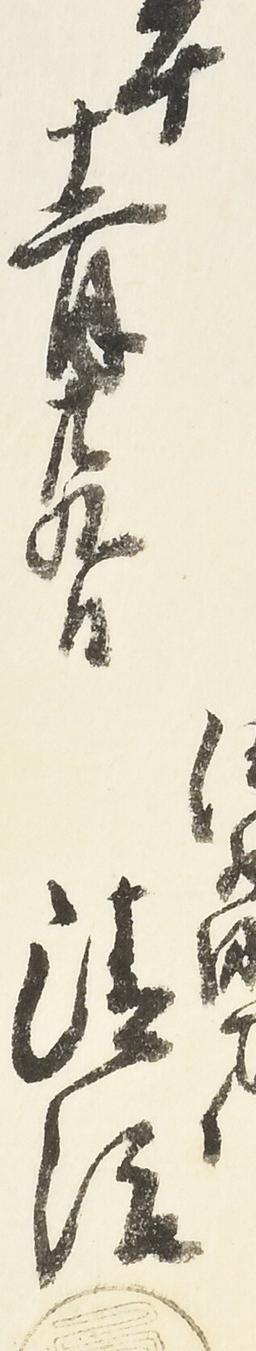十二月廿九日清治

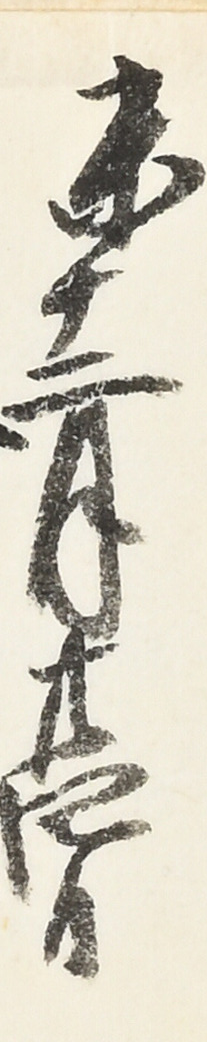未十二月廿四日
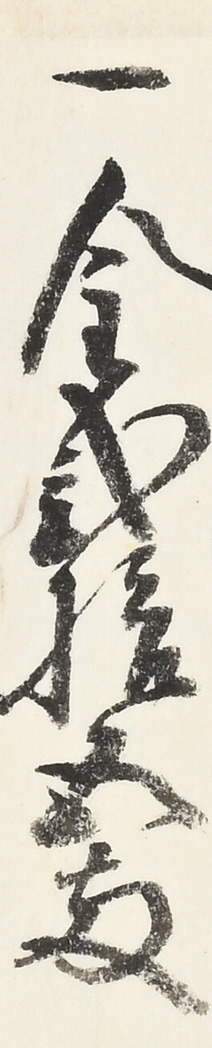一金弐拾五両
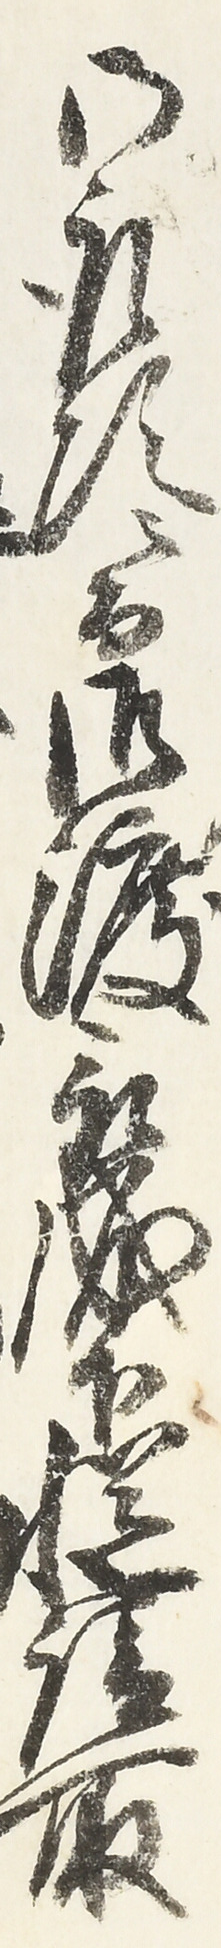御取次ニ而御渡被成下慥請取
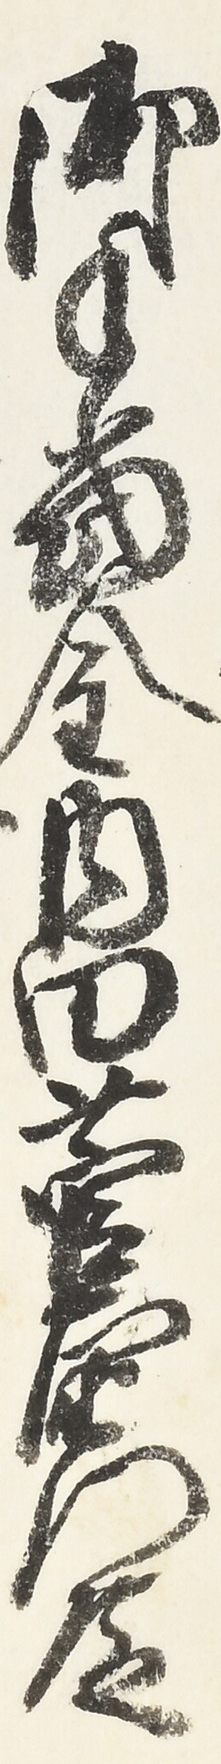御手當金内田菅右衛門殿
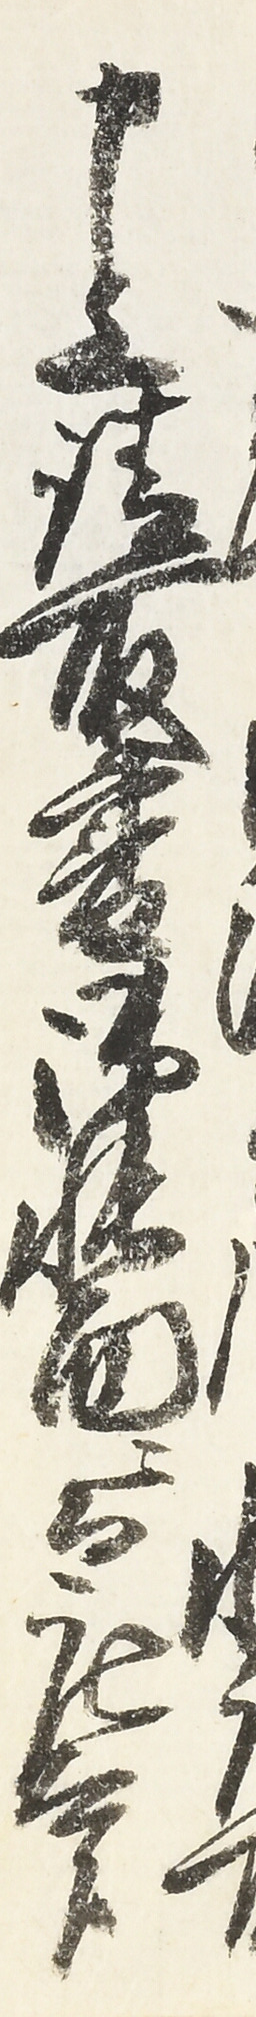申上請取書御帳面ニ而庄左衛門
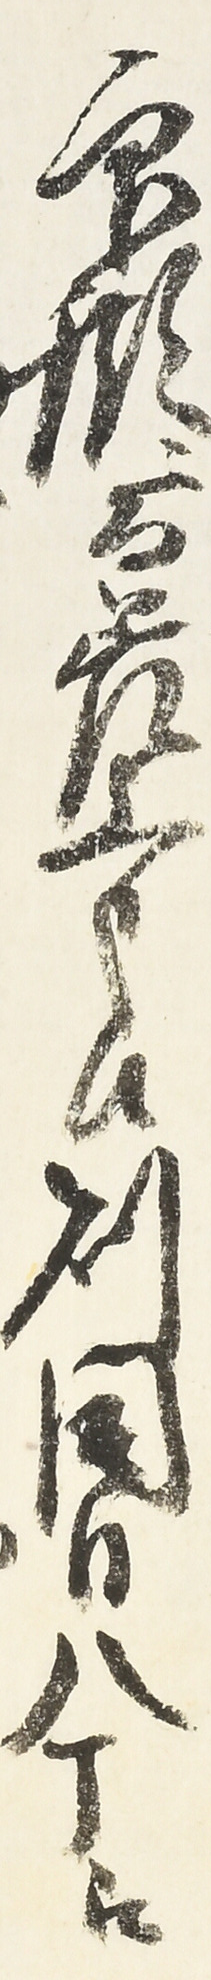印形ニ而差上申候則同日八町江
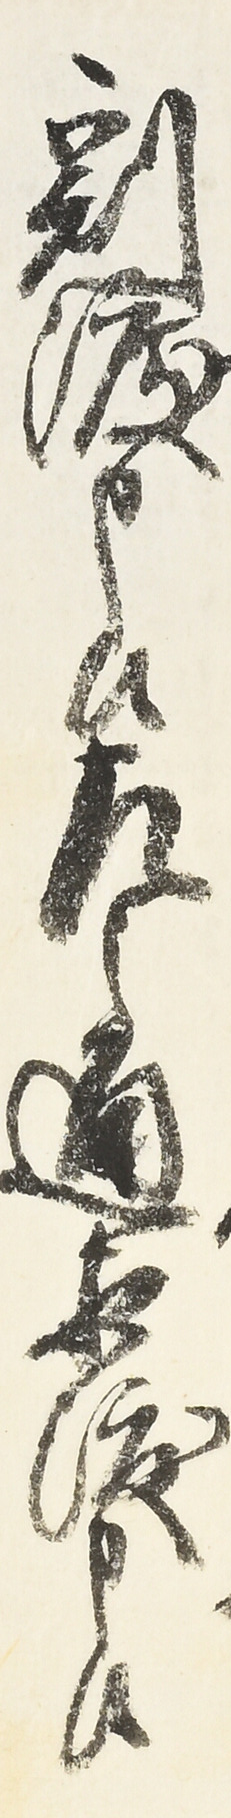割渡申候左之通相渡申候
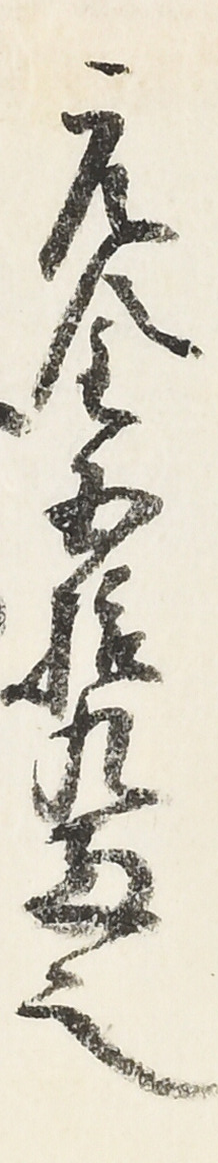元金五拾九両也
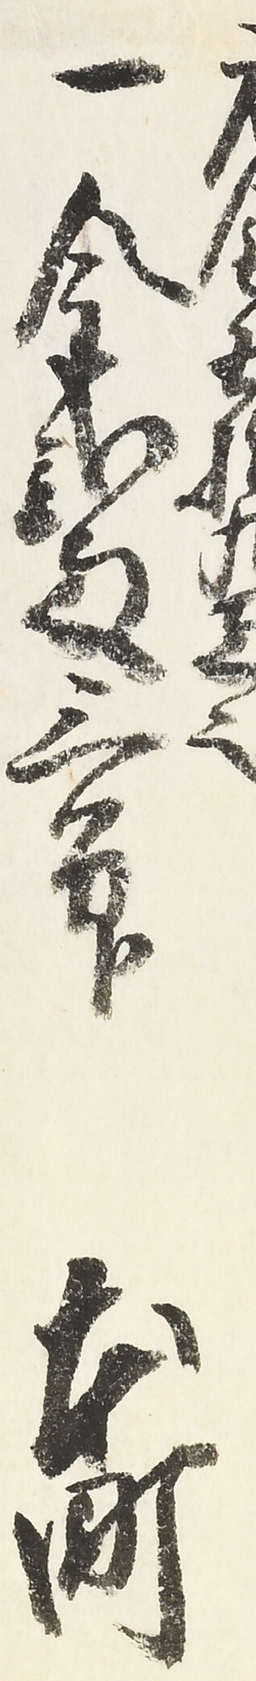一金弐両三分ト本町
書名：御才覚金御利足割渡扣帳
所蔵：伊那市立高遠町図書館・合同会社AMANE
